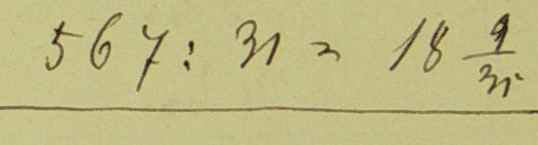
567: 31= 18 9/31
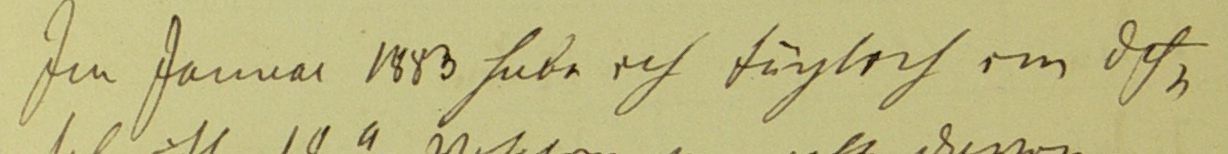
Im Januar 1883 habe ich täglich im Durch¬
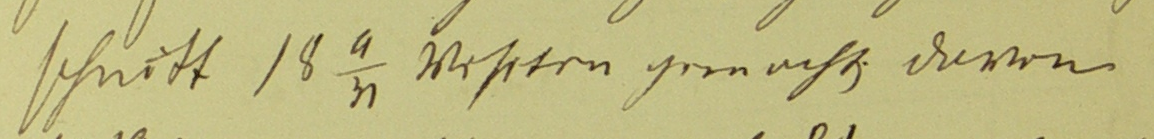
schnitt 18 9/31 Visiten gemach davon
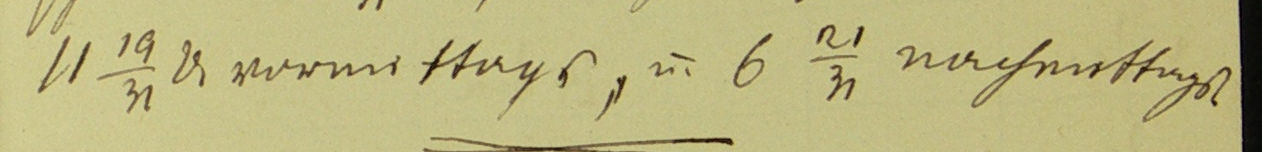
11 19/31 vormittags, und 6 21/31 nachmittags.
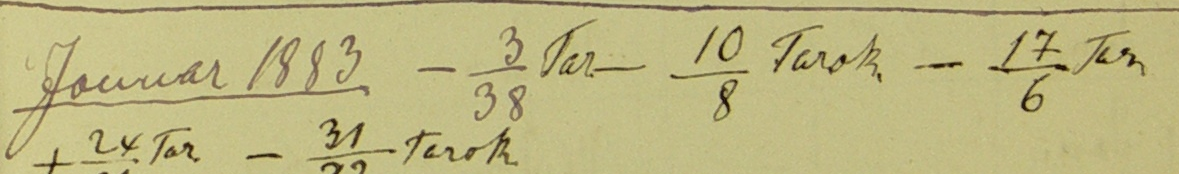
Januar 1883 - 3/38 Tar - 10/8 Tarok - 17/6 Tar
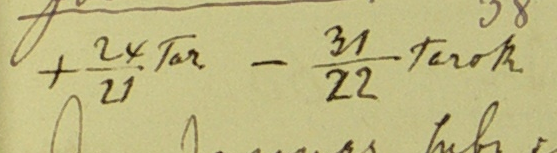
+ 24/21 Tar -31/22 Tarok
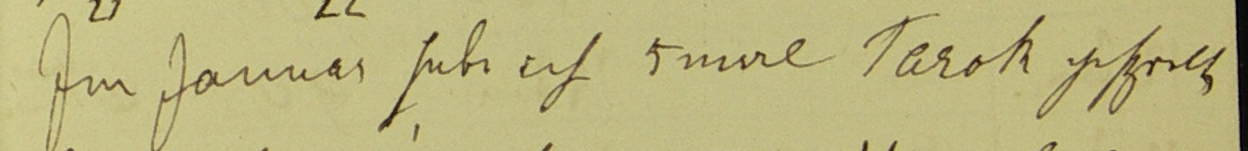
Im Januar habe ich 5 mal Tarok gespielt,
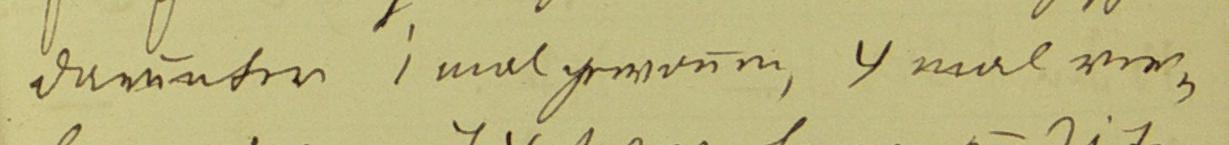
darunter 1 mal gewonnen, 4 mal ver¬
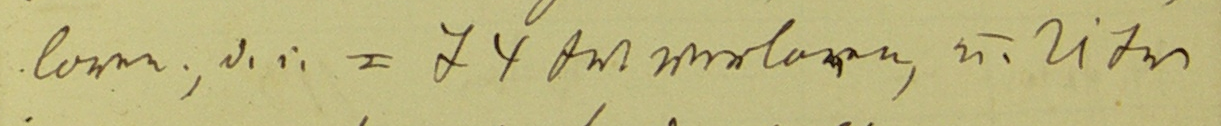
loren; d. i. = 74 tw verloren, und 21 tw
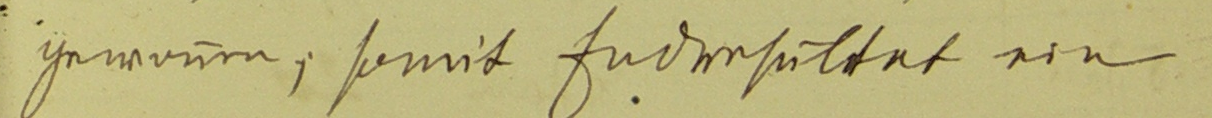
gewonnen, somit Endresultat ein
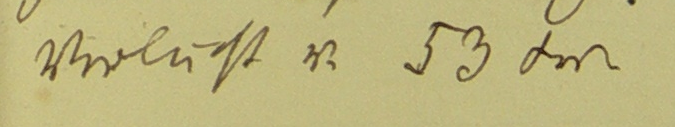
Verlust von 53 Tw.
